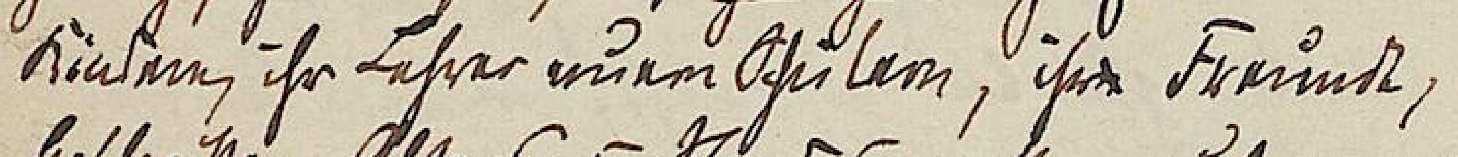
Kindern, ihr Lehrer euren Schülern, ihre Freunde,
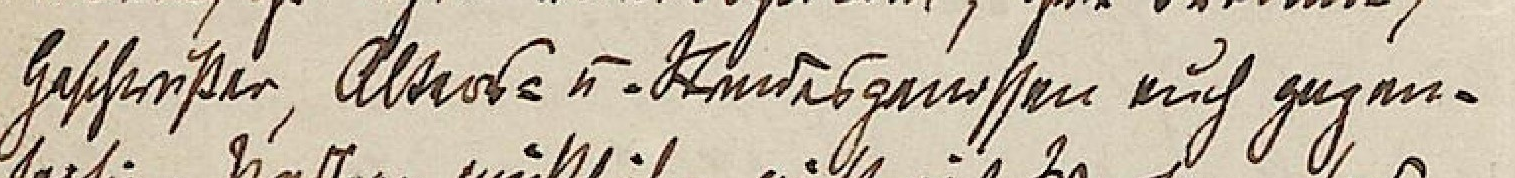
Geschwister, Alters u. Standesgenossen euch gegen¬
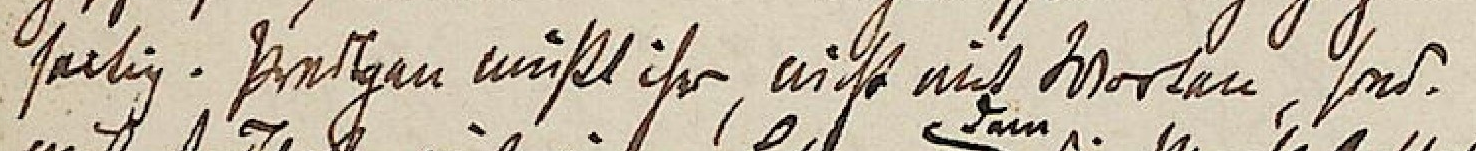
seitig. Predigen müßt ihr nicht mit Worten, sond.
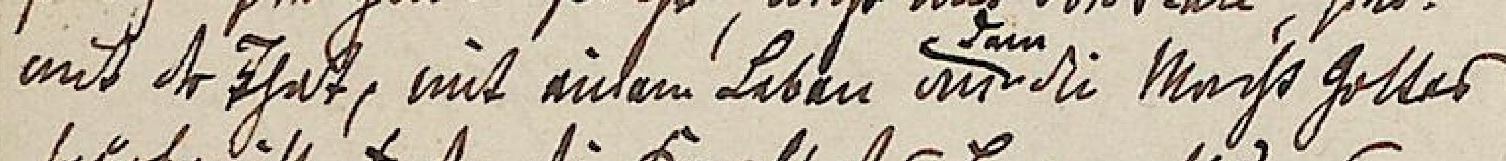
mit der That, mit einem Leben an die Macht Gottes
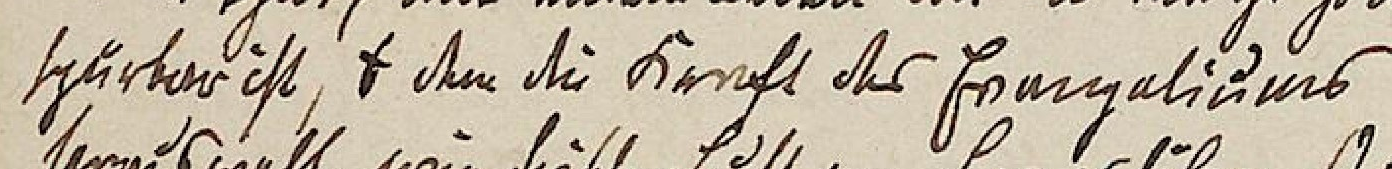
spürbar ist, s dem die Kraft des Evangeliums
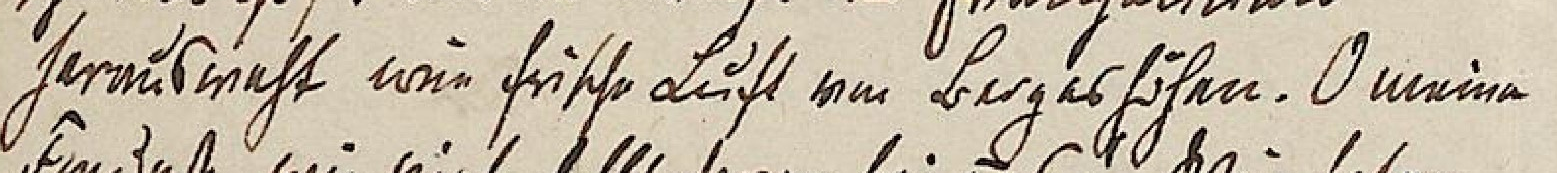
herausweht, wie frische Luft von Bergeshöhen. O meine
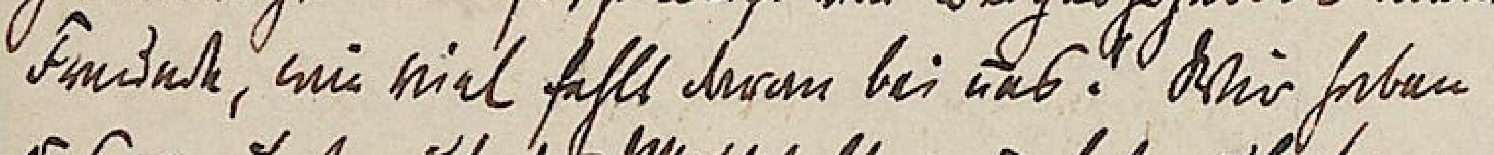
Freunde, wie viel fehlt daran bei uns! Wir haben
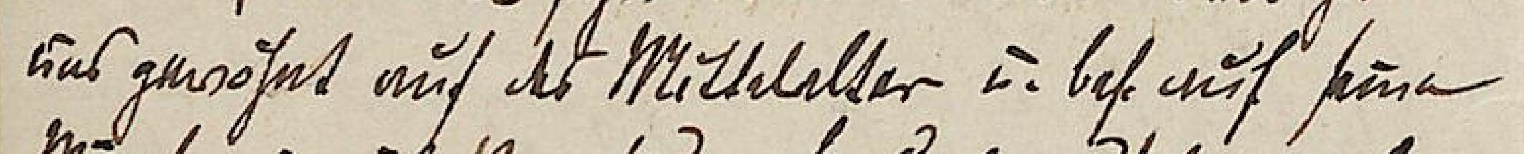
uns gewöhnt auf das Mittelalter u. bes. auf seine
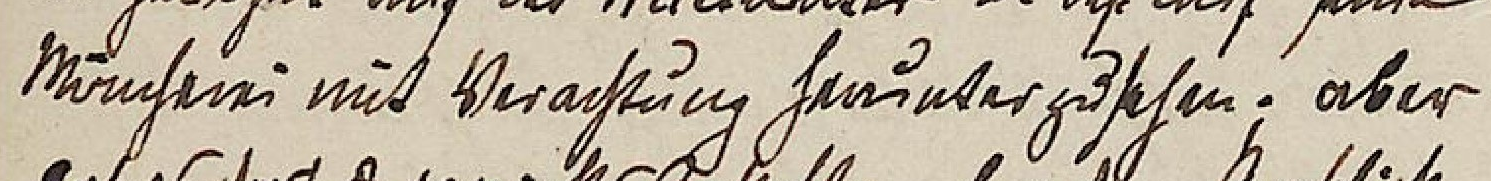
Möncherei mit Verachtung herunterzusehen; aber
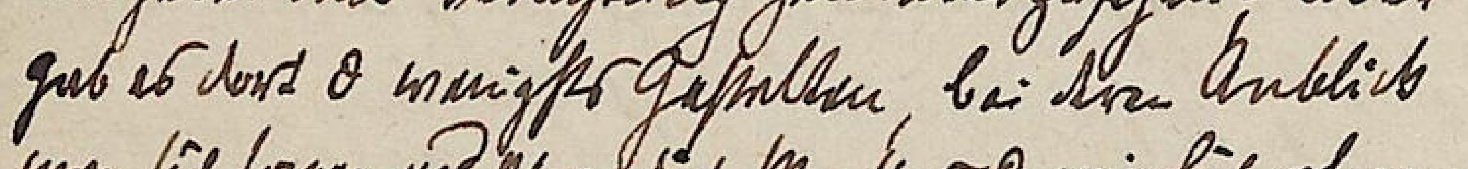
gab es dort o wenigstens Gestalten, bei deren Anblick
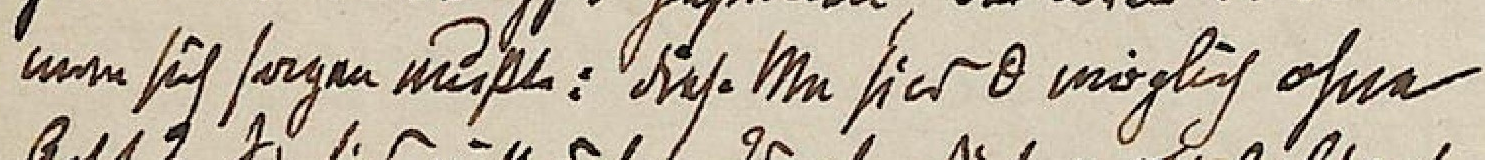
man sich sagen mußte: diese Mn sind o möglich ohne
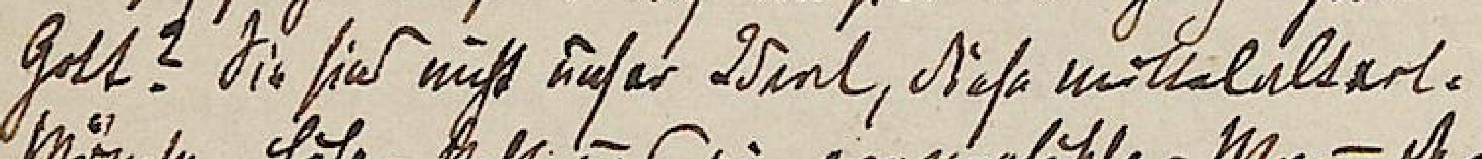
Gott? Sie sind nicht unser Ideal, diese mittelalterl.
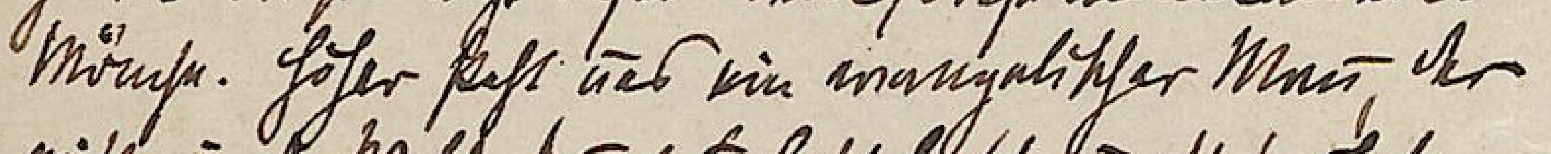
Mönche. Höher steht uns ein evangelischer Man, der
